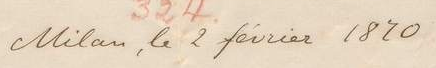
Milan, le 2 février 1870
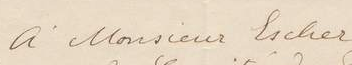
A Monsieur Escher
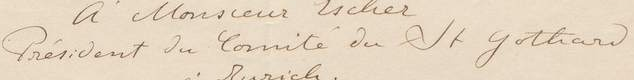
Président du Comité du St Gothard
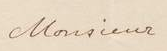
Monsieur
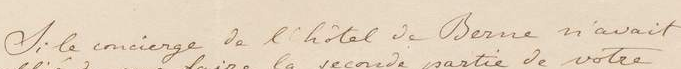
Si le concierge de l`hôtel de Berne n`avait
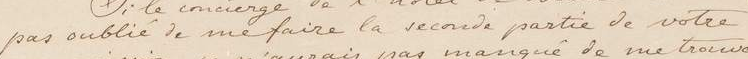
pas oublié de me faire la seconde partie de votre
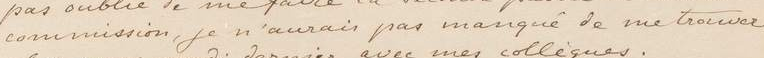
commission, je n`aurais pas manqué de me trouver
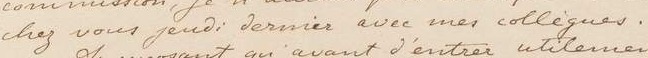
chez vous jeudi dernier avec mes collègues.
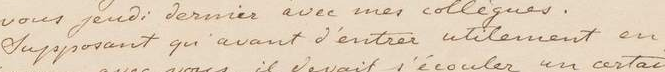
Supposant qu`avant d`entrer utilement en
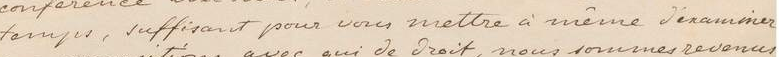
temps, suffisant pour vous mettre à même d`examiner
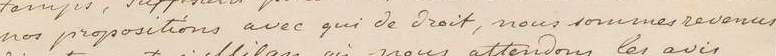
nos propositions avec qui de droit, nous sommes revenus
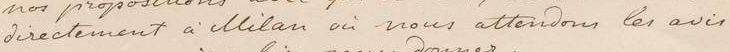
directement à Milan où nous attendons les avis
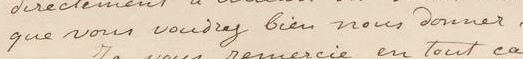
que vous voudrez bien nous donner.
